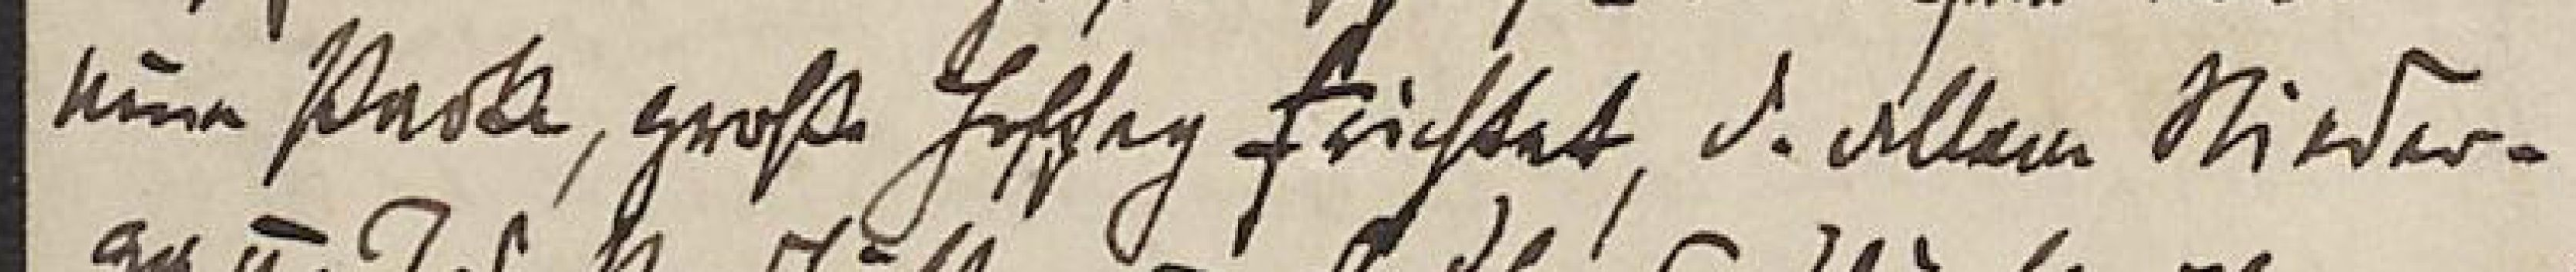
eine starke, große Hoffng frichtet, d. allem Nieder¬
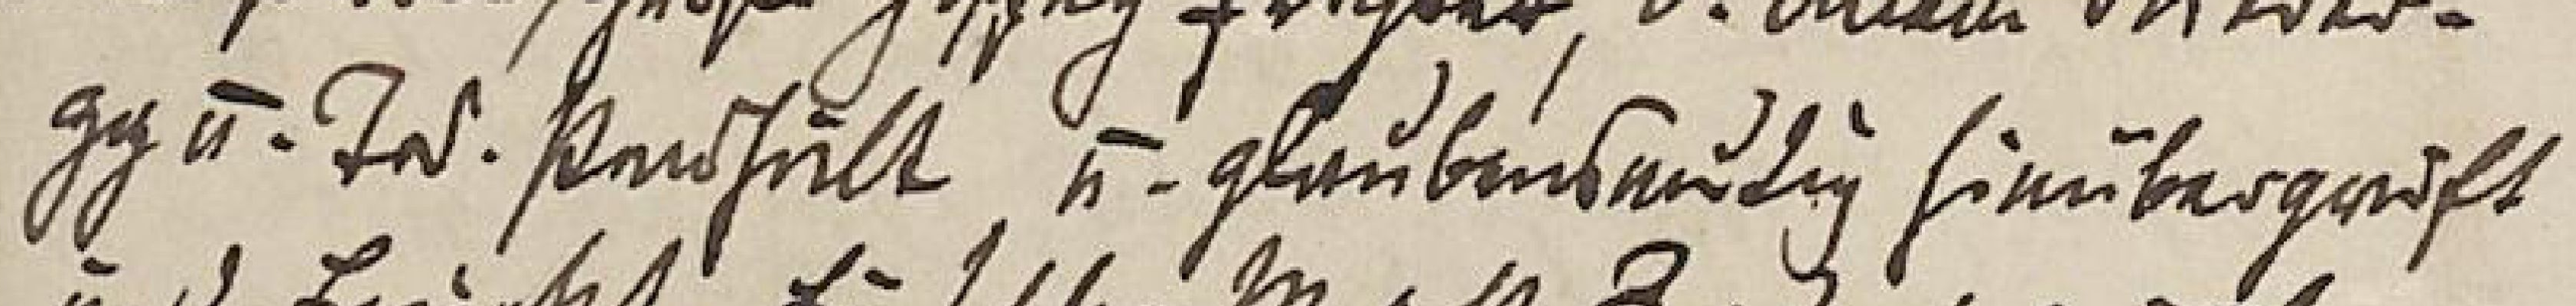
gg u. Tod standhällt u glaubensmutig hinübergreift
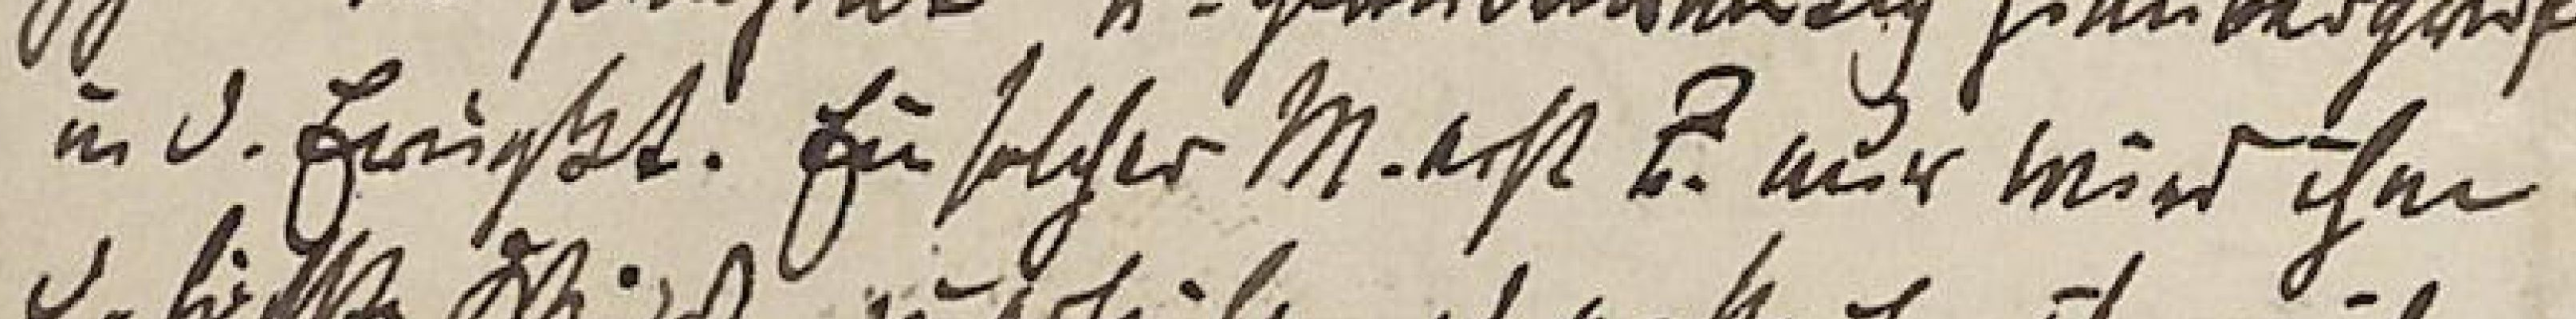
in d. Ewigkt. Ein solcher M. erst u. nur wird ihm
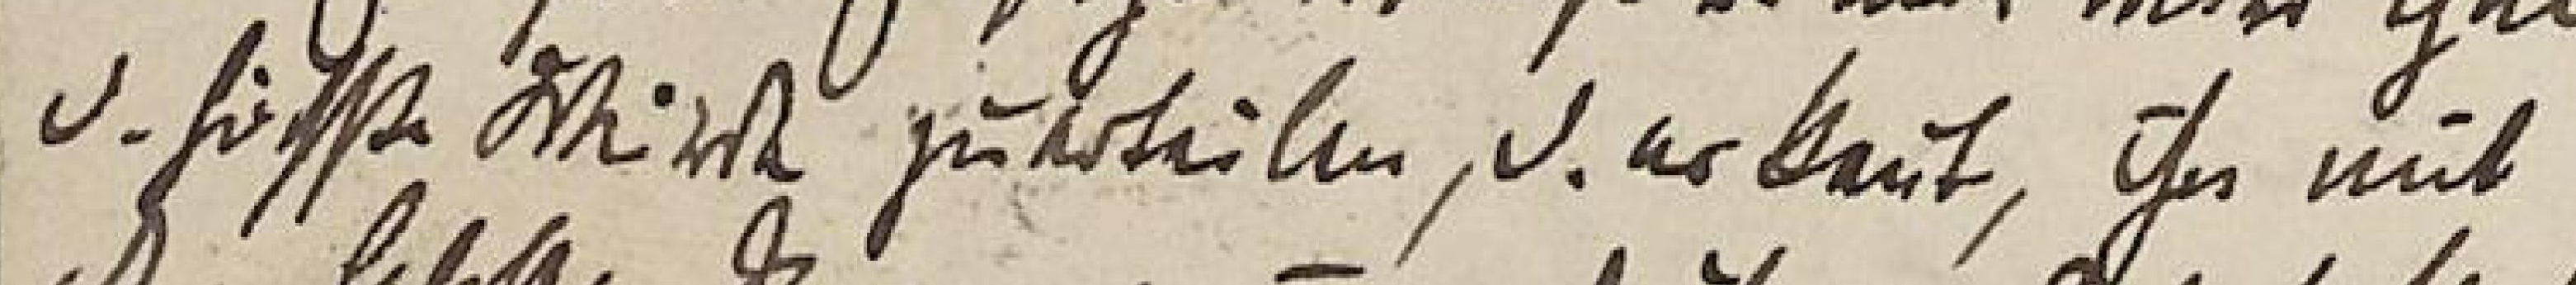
d. höchste Würde zuerteilen, d. er kent, uhn mit
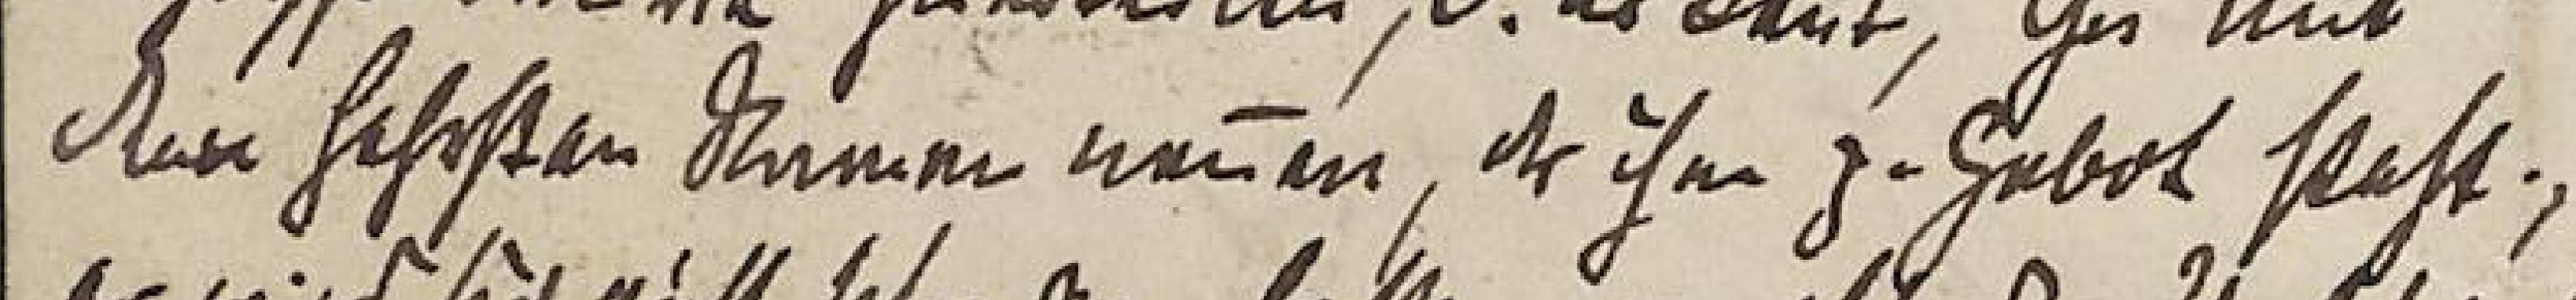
dem hehrsten Namen nenen, dr ihm z. Gebote steht;
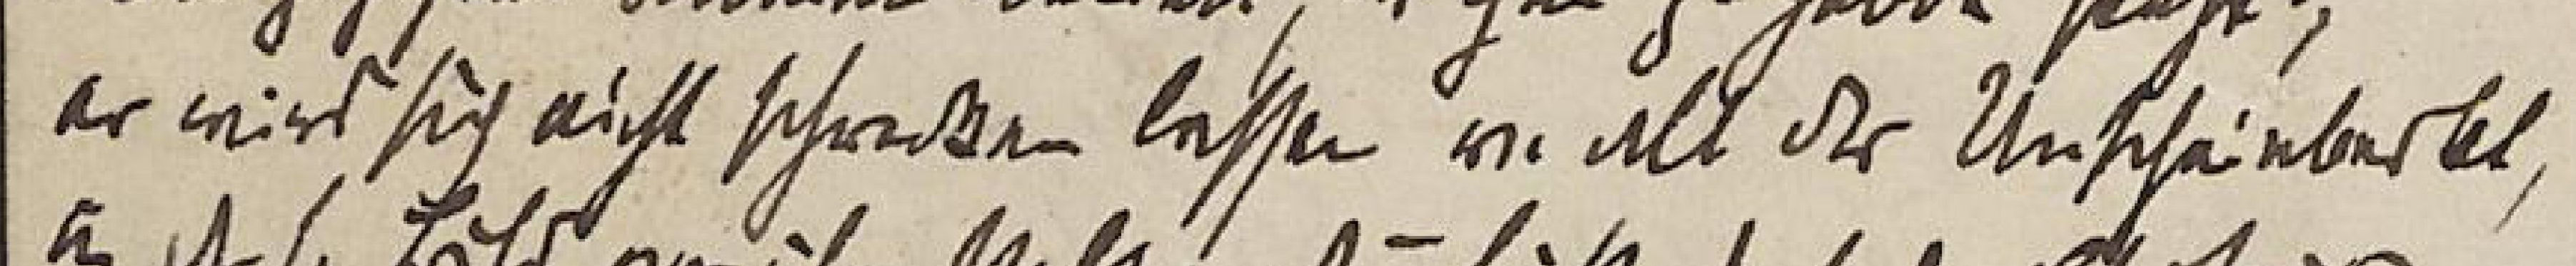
er wird sich nicht schrecken lassen v. all der Unscheinbarkt,
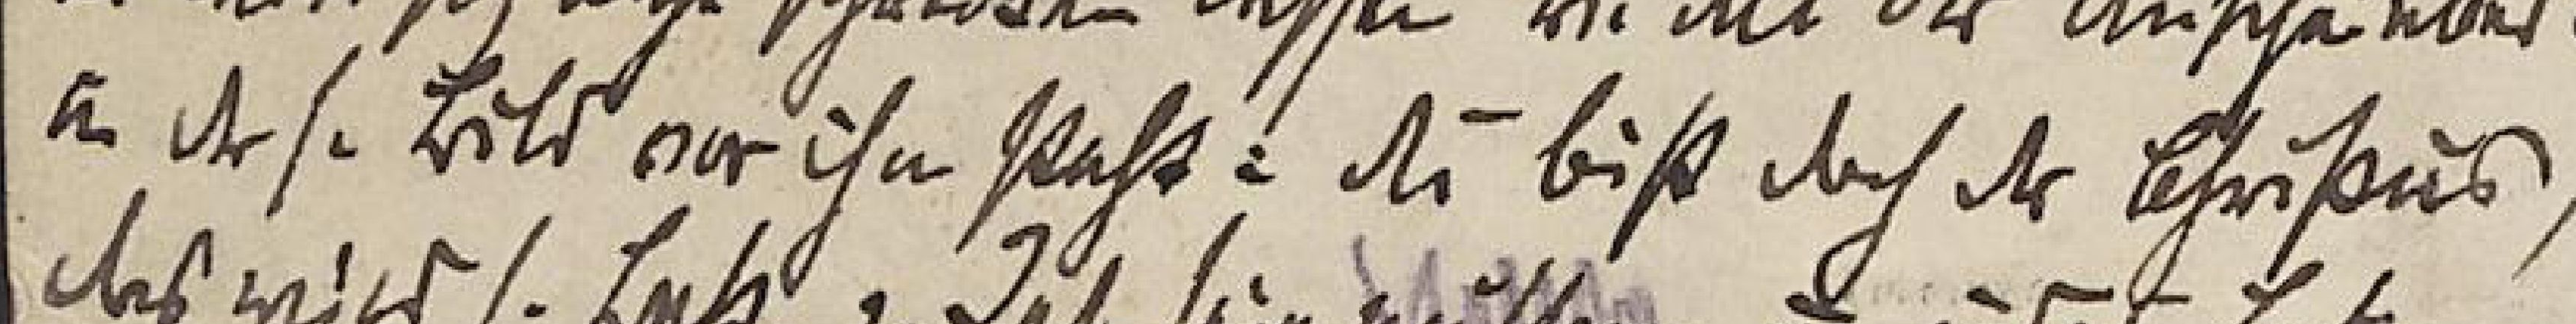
in dr. s. Bild vor ihm steht: Du bist doch dr Christus,
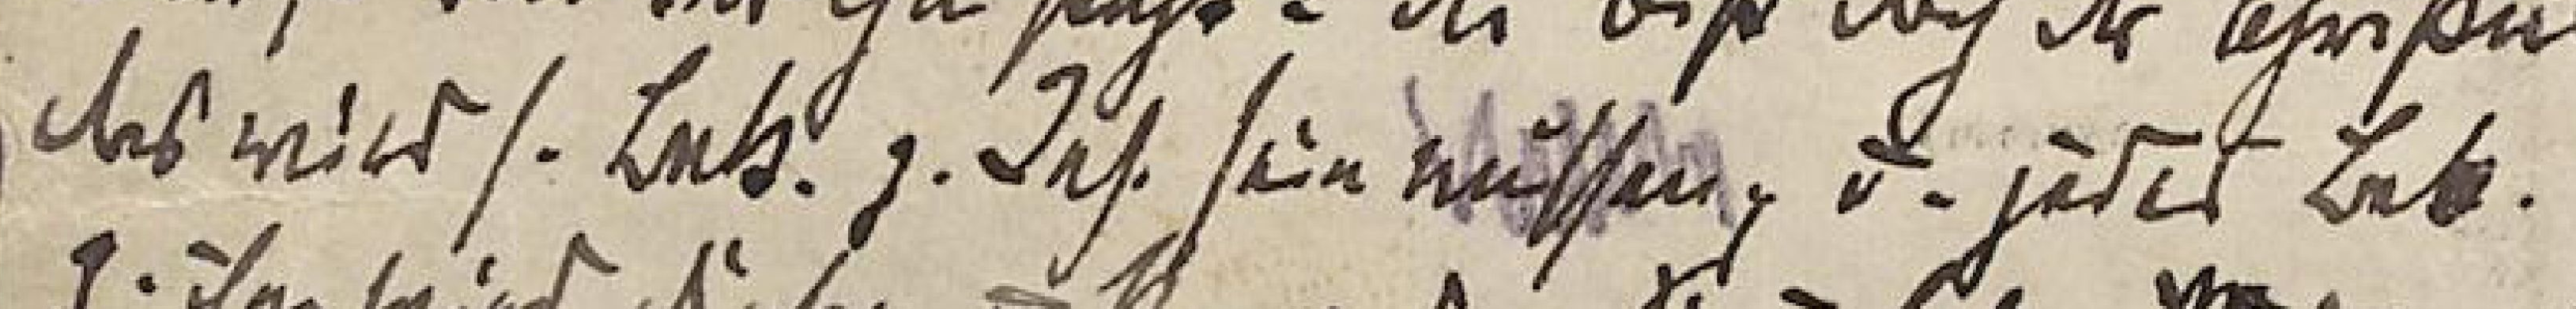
das wird s. Bek. z. Jes. sein müssen; u. jedes Bek.
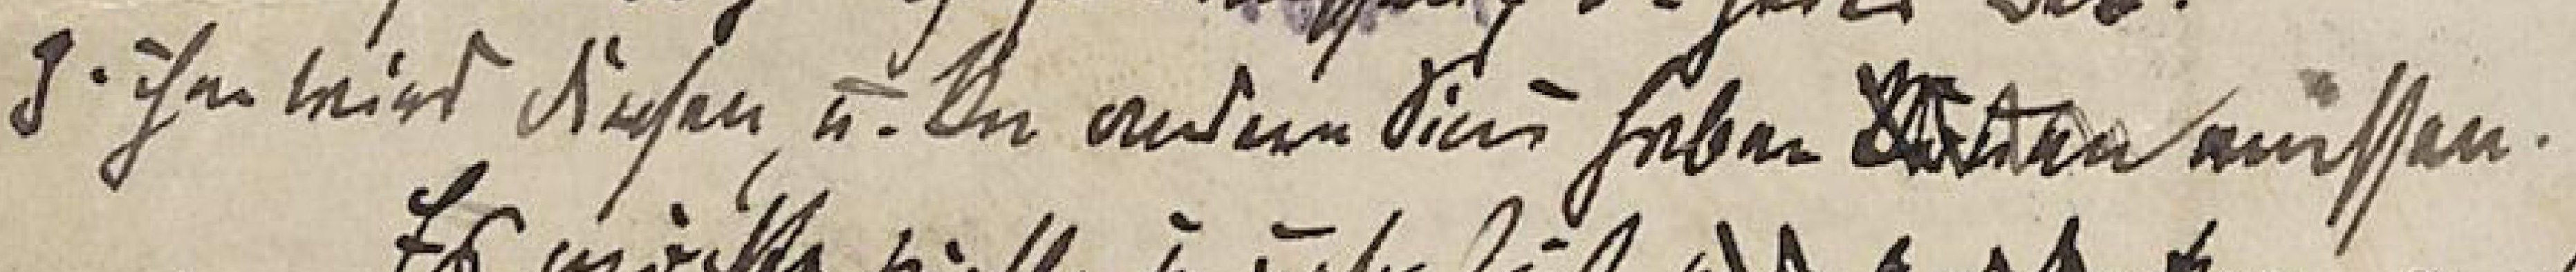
z. uhm wird diesen, u. kn. andern Sin haben könen müssen.
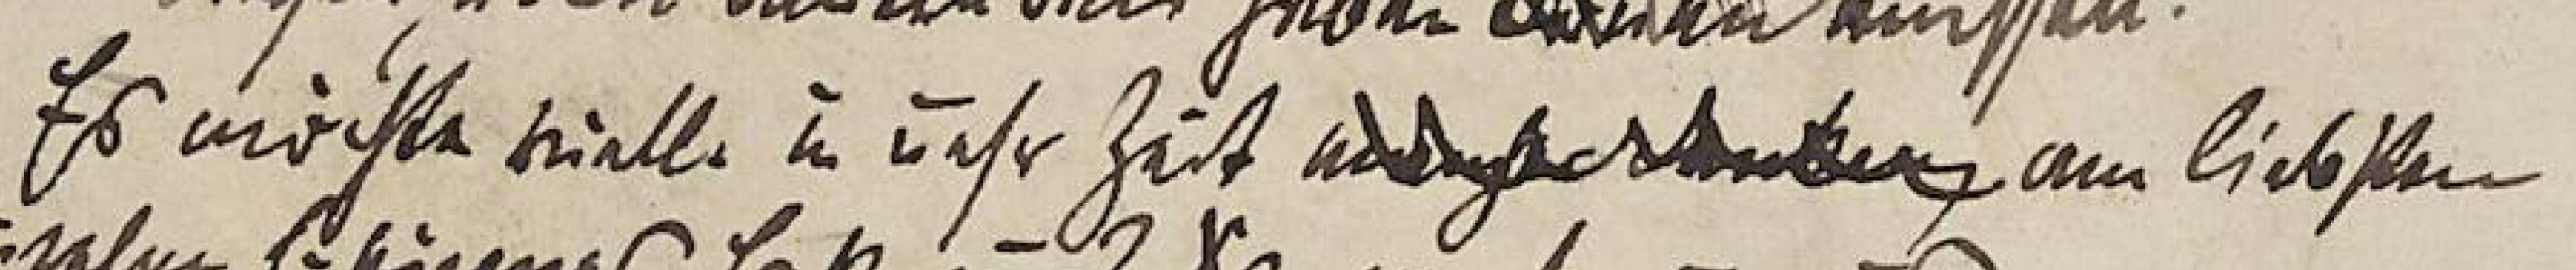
Es möchte viell. in unsr Zeit mancher denken, am leibsten
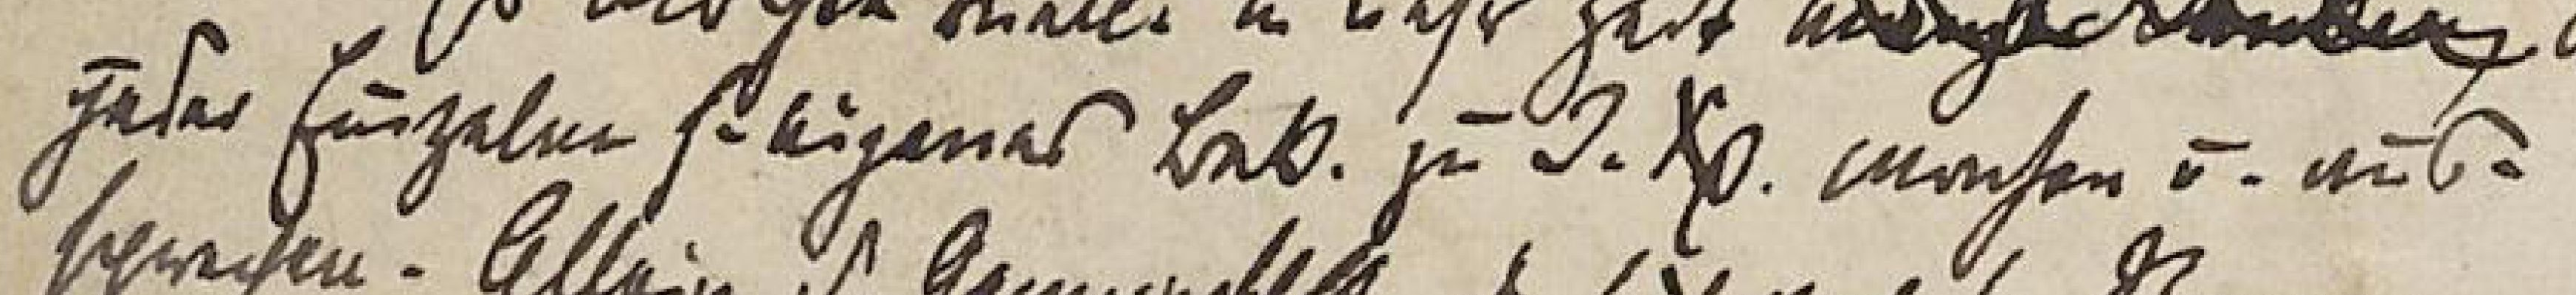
jeder Einzelne s. eigenes Bek. zu J. Χρ. machen u. aus¬
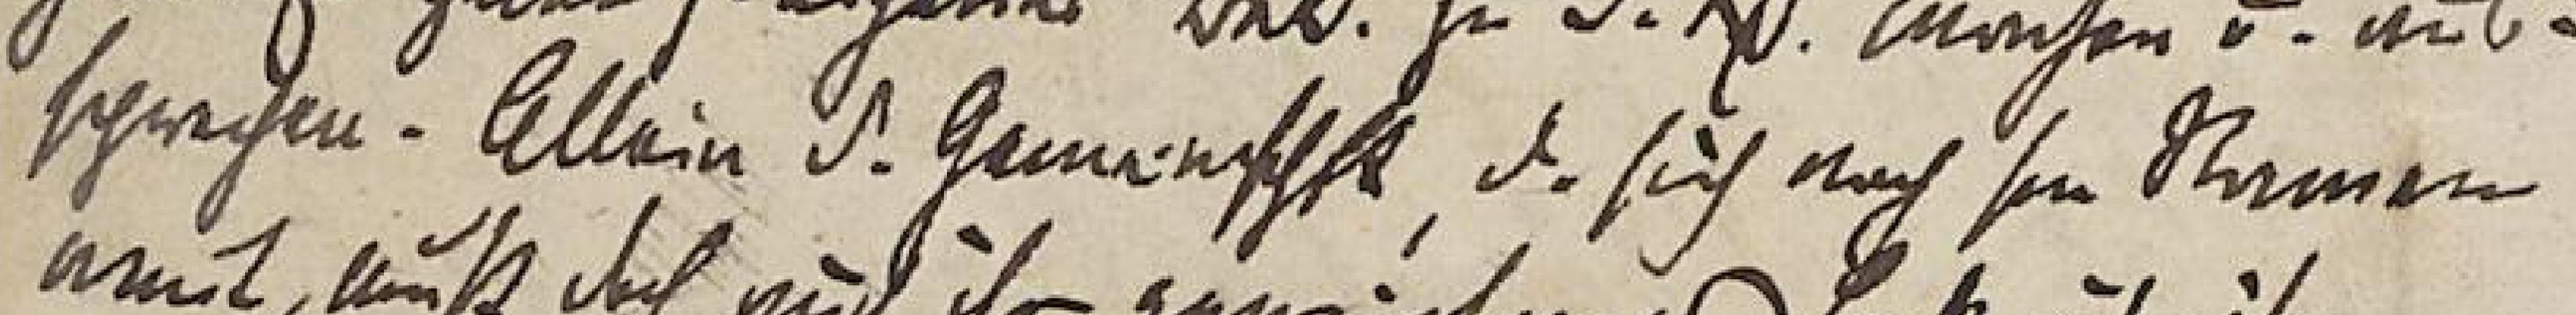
sprechen. Allein d. Gemeinschaft, d. sich nach sm Namen
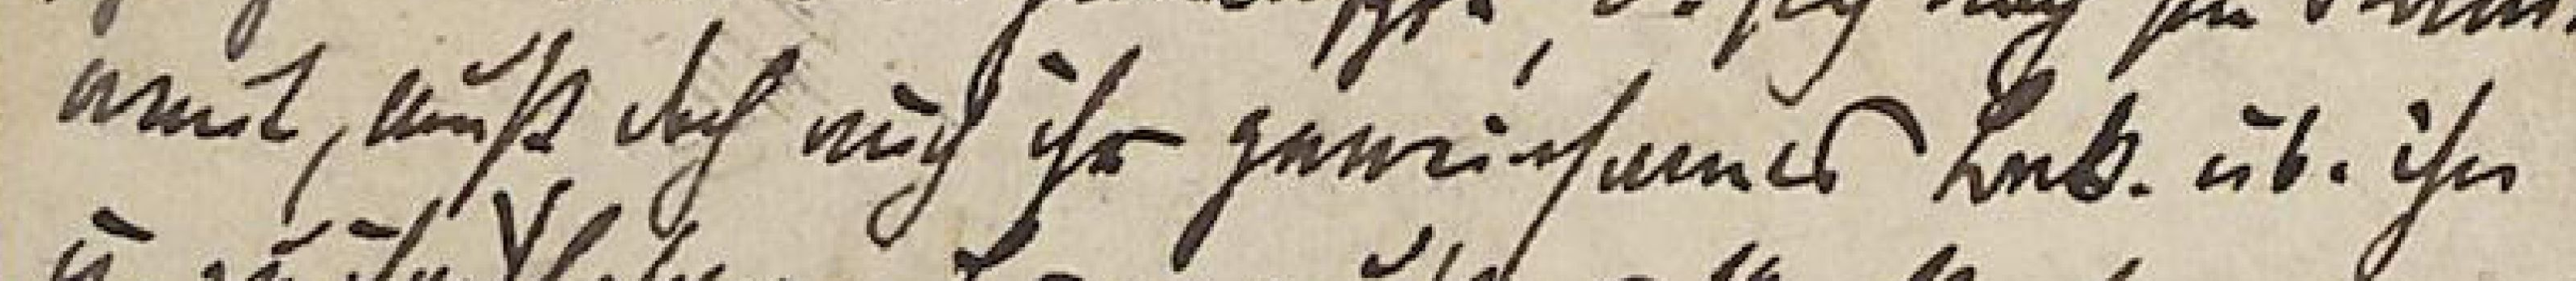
nent, muß doch auch ihr gemeinsames Bek. üb. ihn
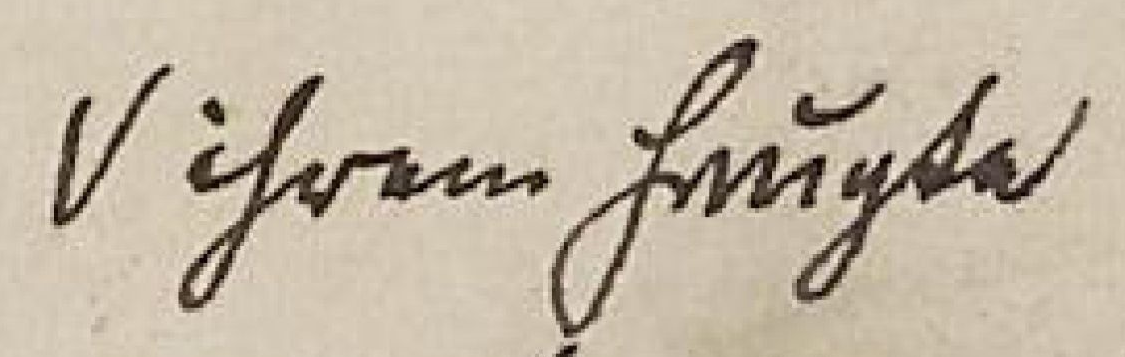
V ihrem Haupte
